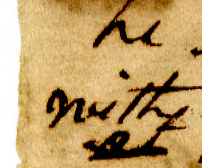with
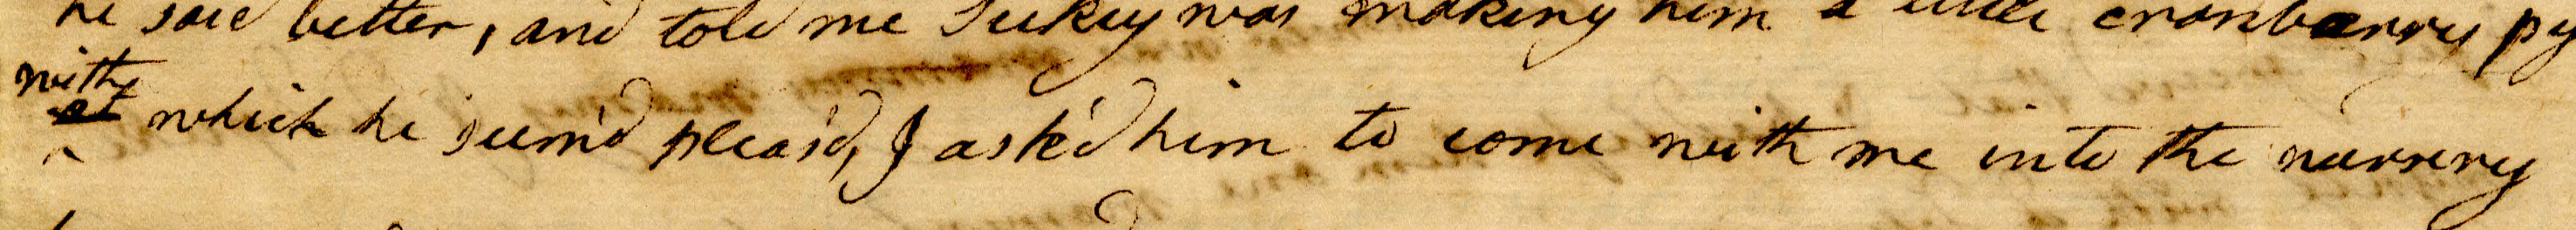^ [at] which he seem'd pleas'd, I ask'd him to come with me into the nursery
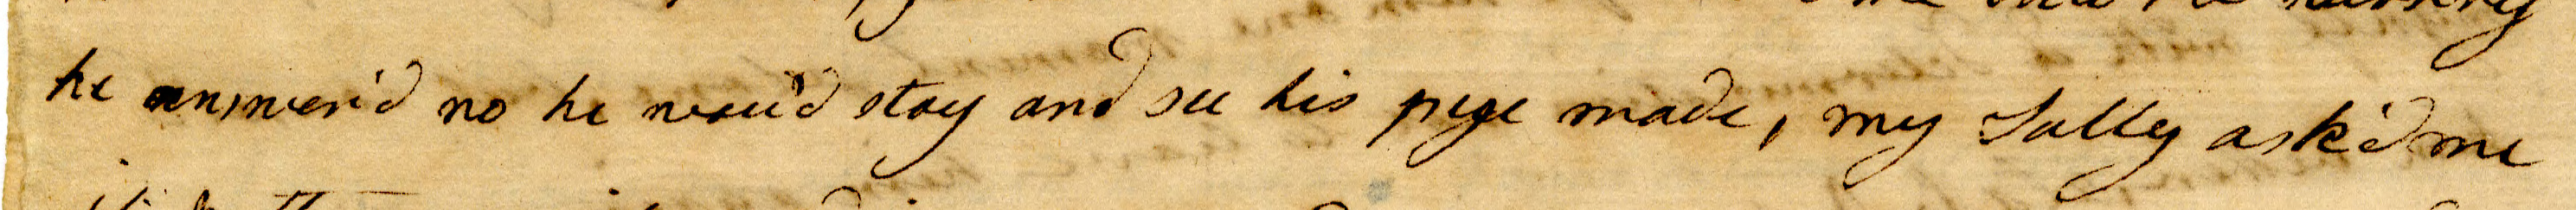he answer'd no he wou'd stay and see his pye made, my Sally ask'd me
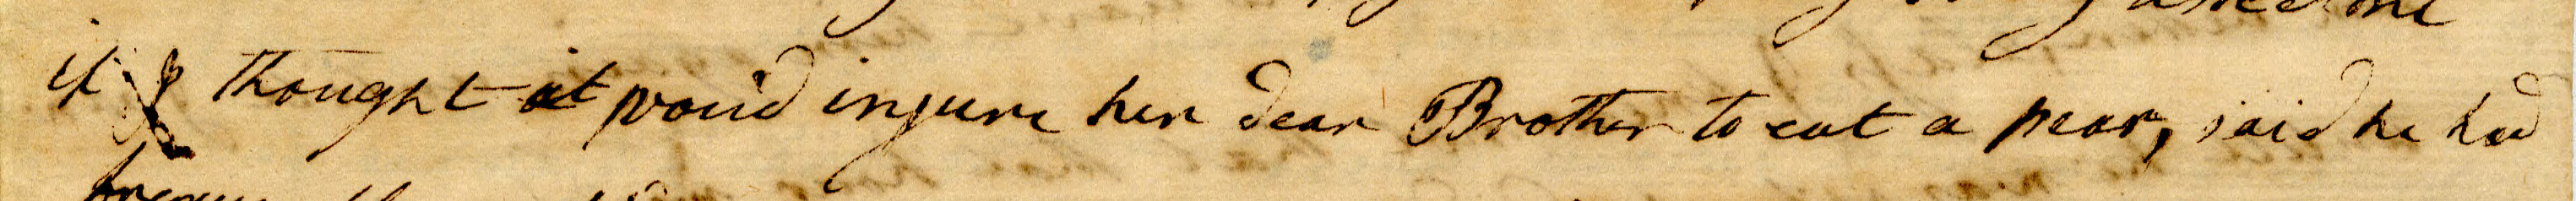if I thought it wou'd injure her dear Brother to eat a pear, said he had
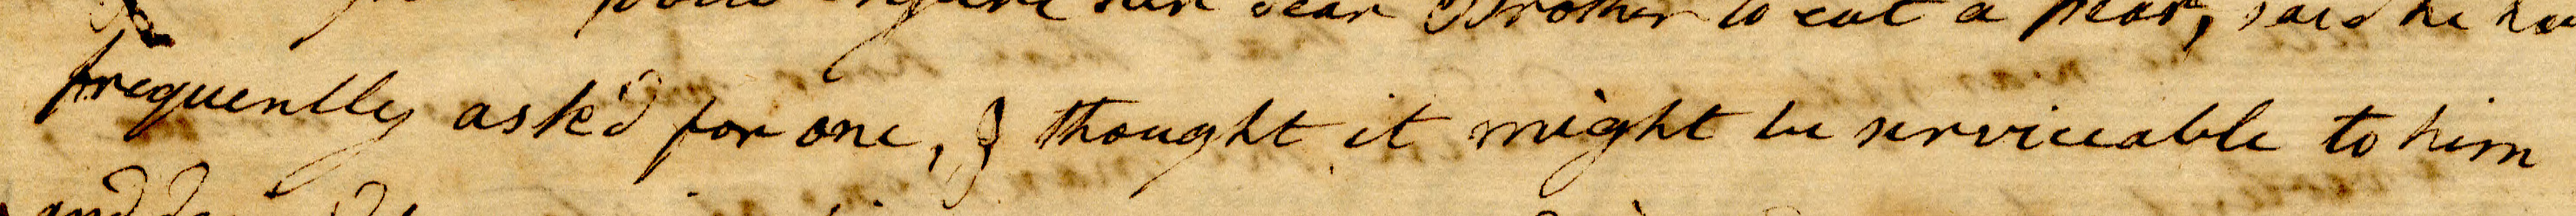frequently ask'd for one, I thought it might be serviceable to him
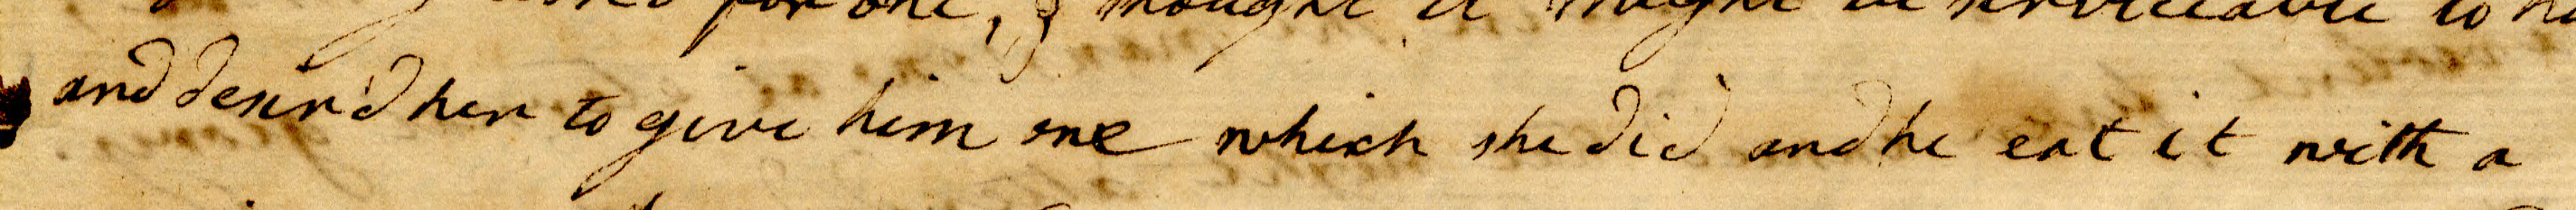and desir'd her to give him one which she did and he eat it with a
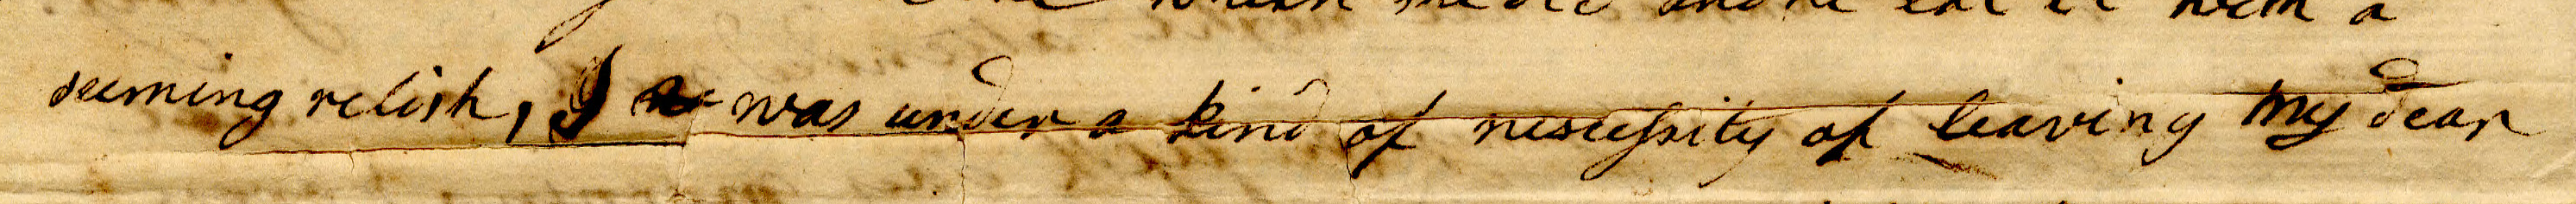seeming relish, I [_] was under a kind of nescessity of leaving my dear
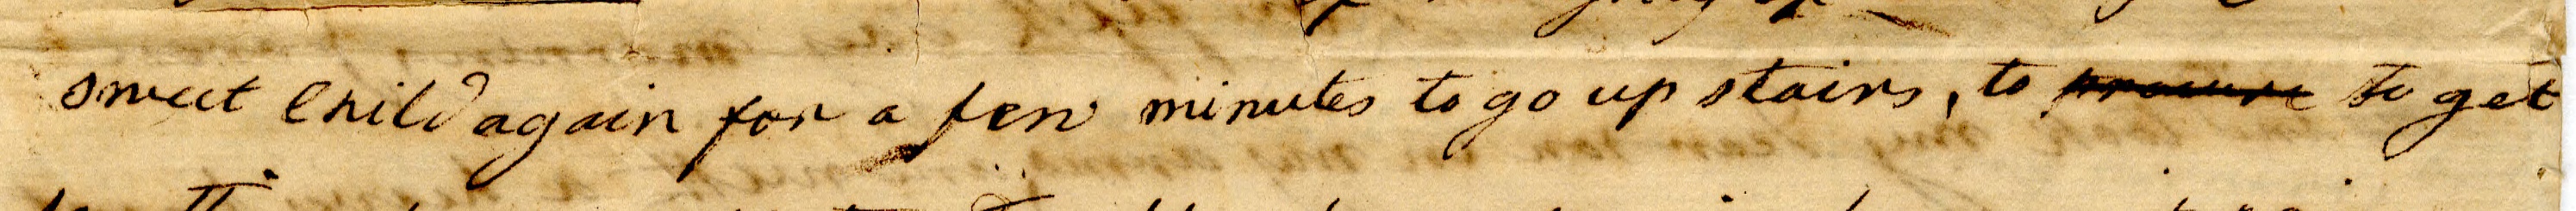sweet Child again for a few minutes to go up stairs, to [procure] to get
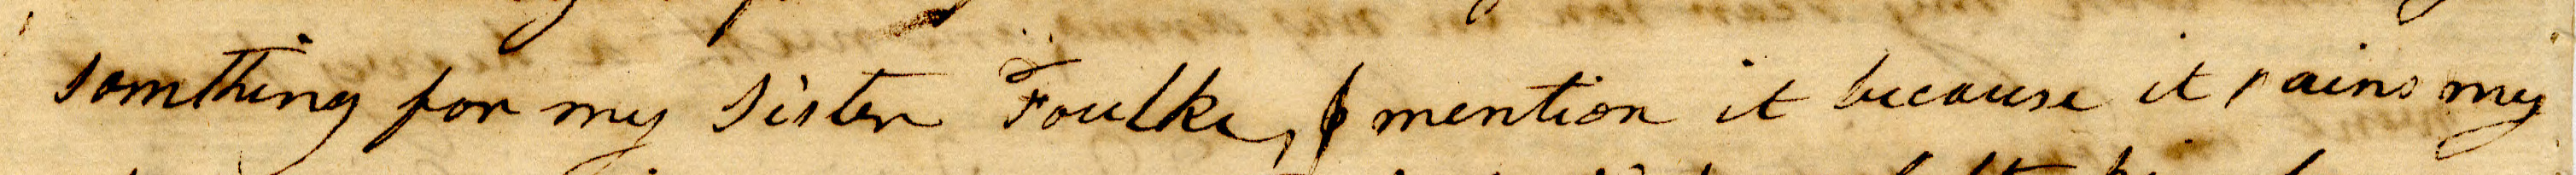something for my sister Foulke, I mention it because it pains my
